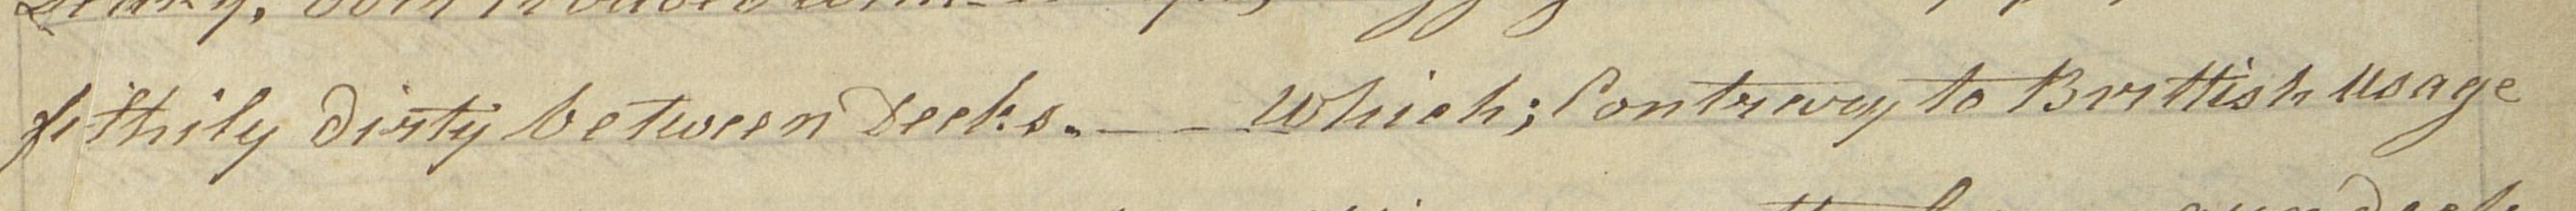fithily dirty between docks. Which; Contrary to Brittish Usage
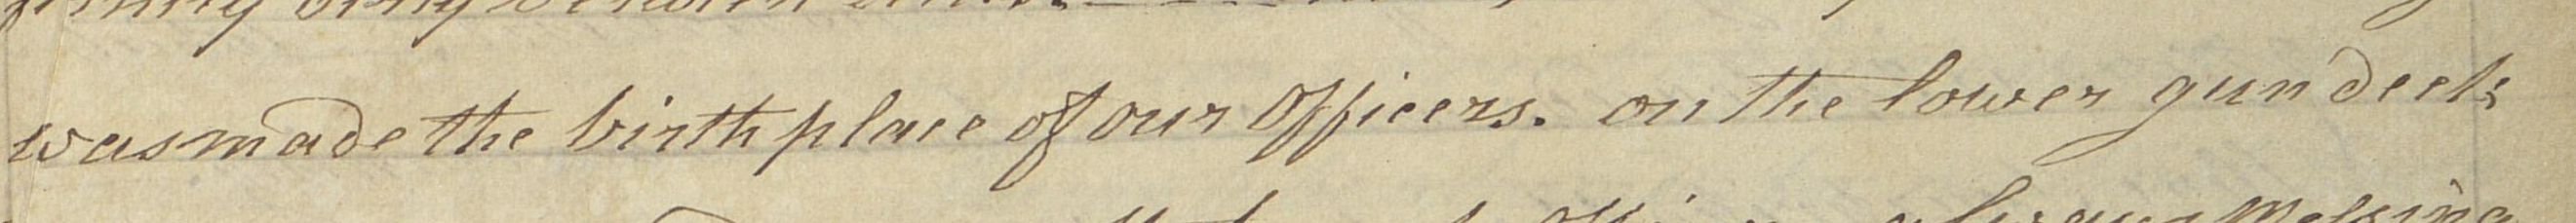was made the birth place of our Officers. on the lower gundeck
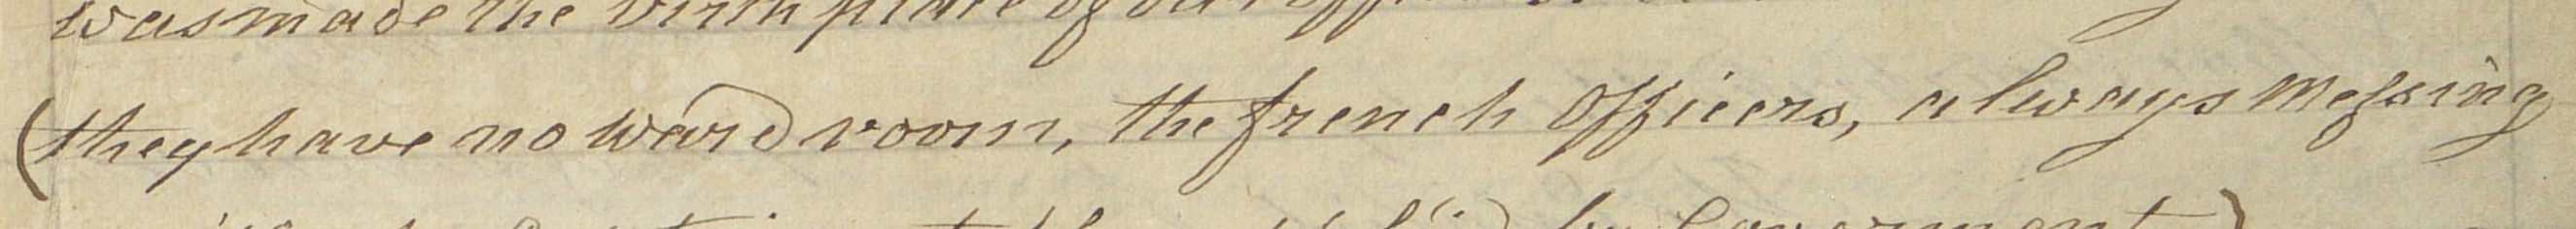(They have no ward room, the french Officers, always messing
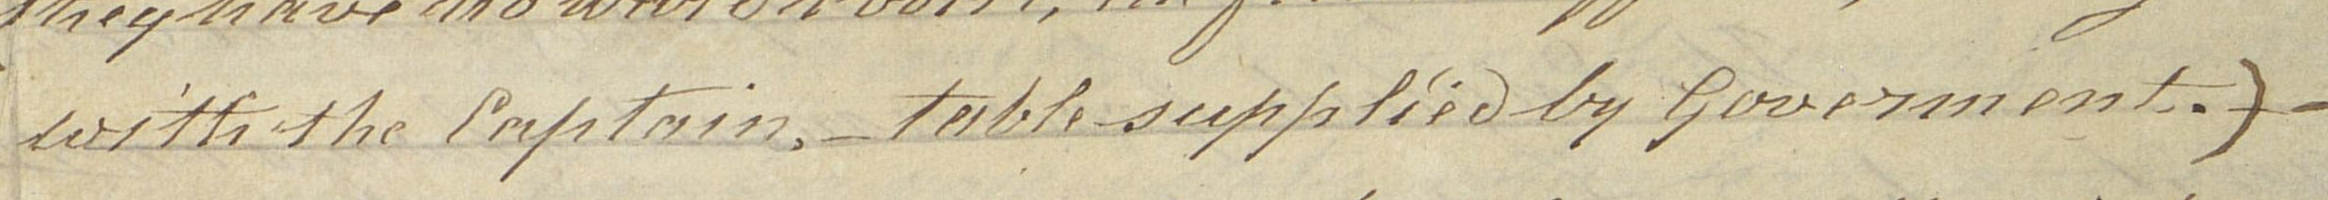with the Captain- tabl supplied by Govorment.y
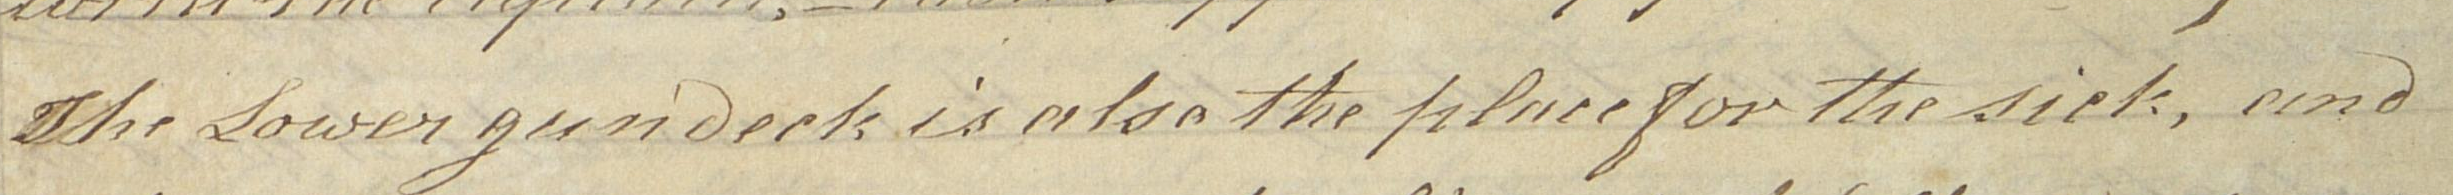The Lower gundect is also the pluinfor the sict, and
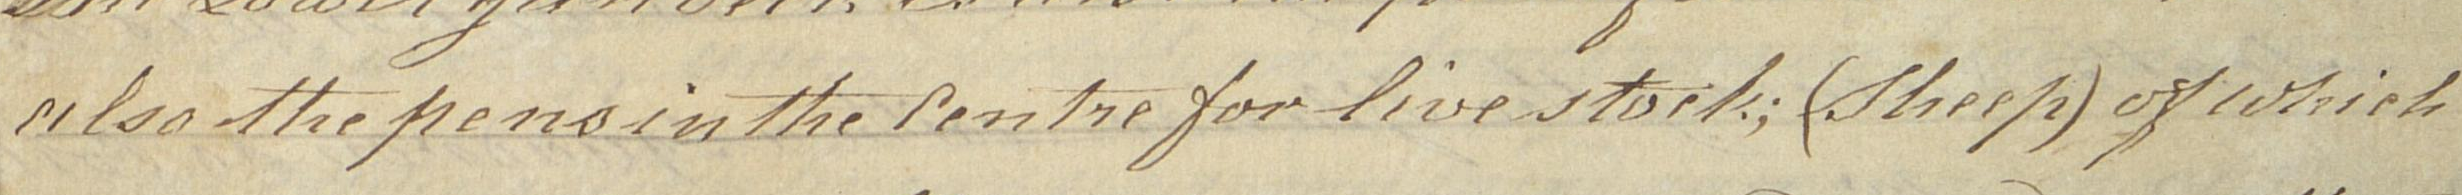also the pens in the centre for live stock; (Sheep) of which
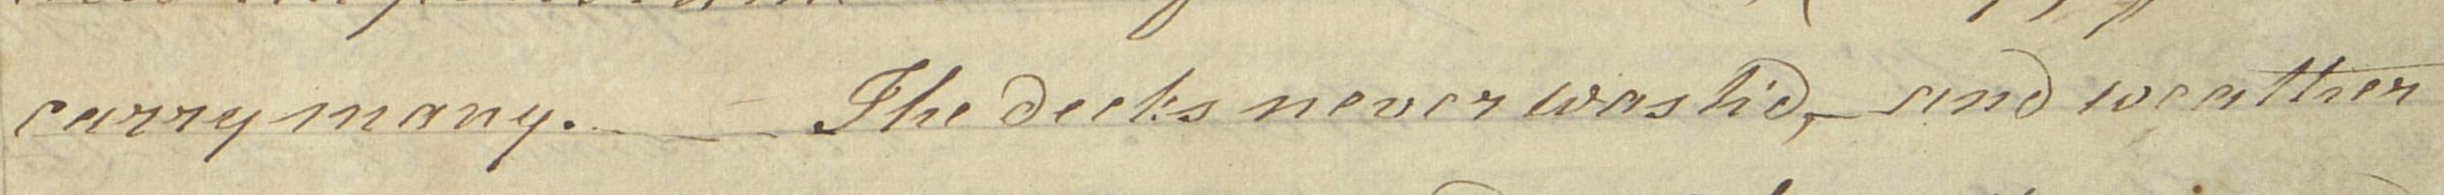carry mony.- The deeks never wash'd,- nd wogathoe
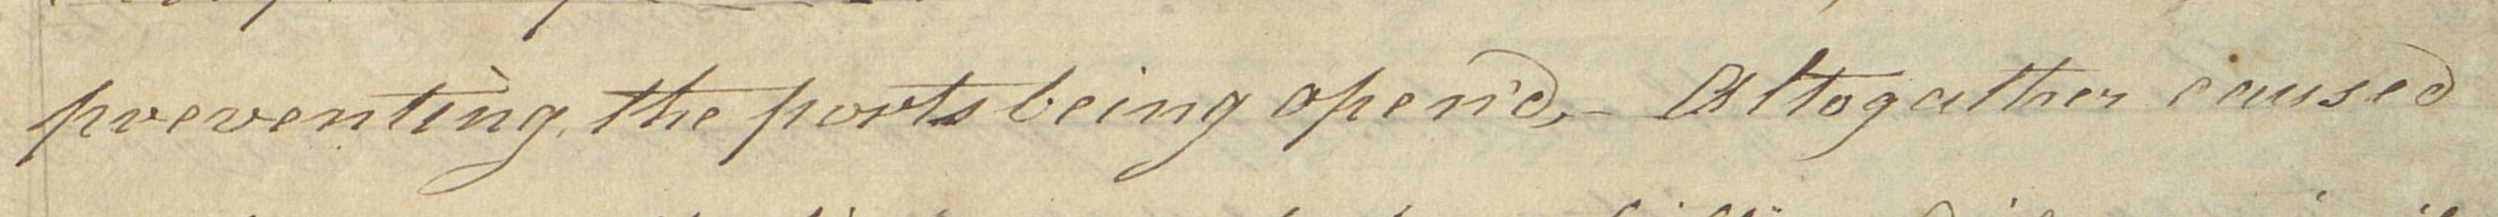preventing the ports being open'd Altogather caused
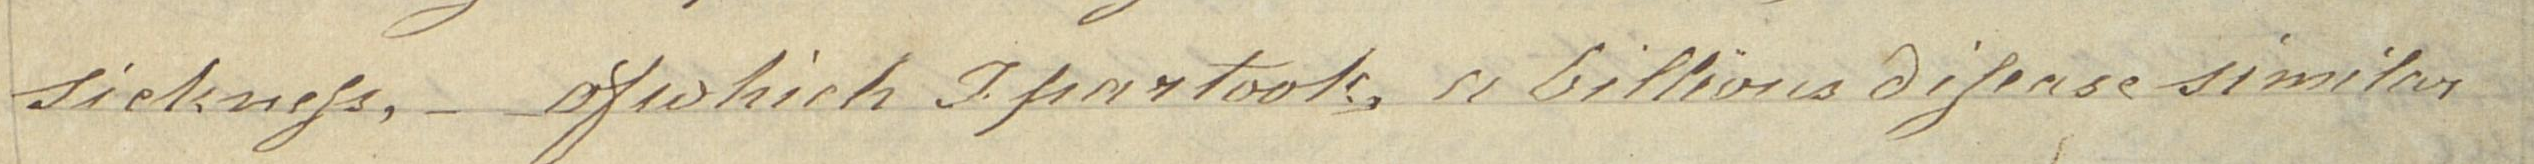Sickness,- of which I partook a billious disease similar
